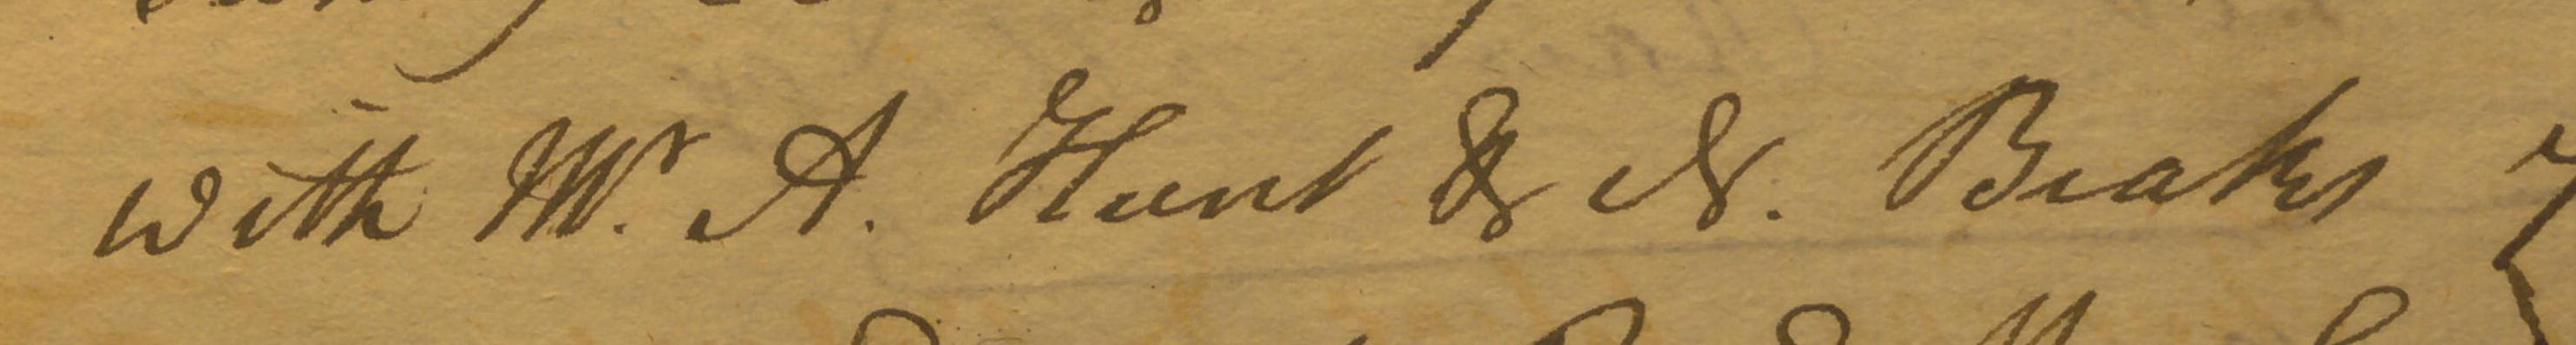with M^r. A. Hunt & N. Beaks
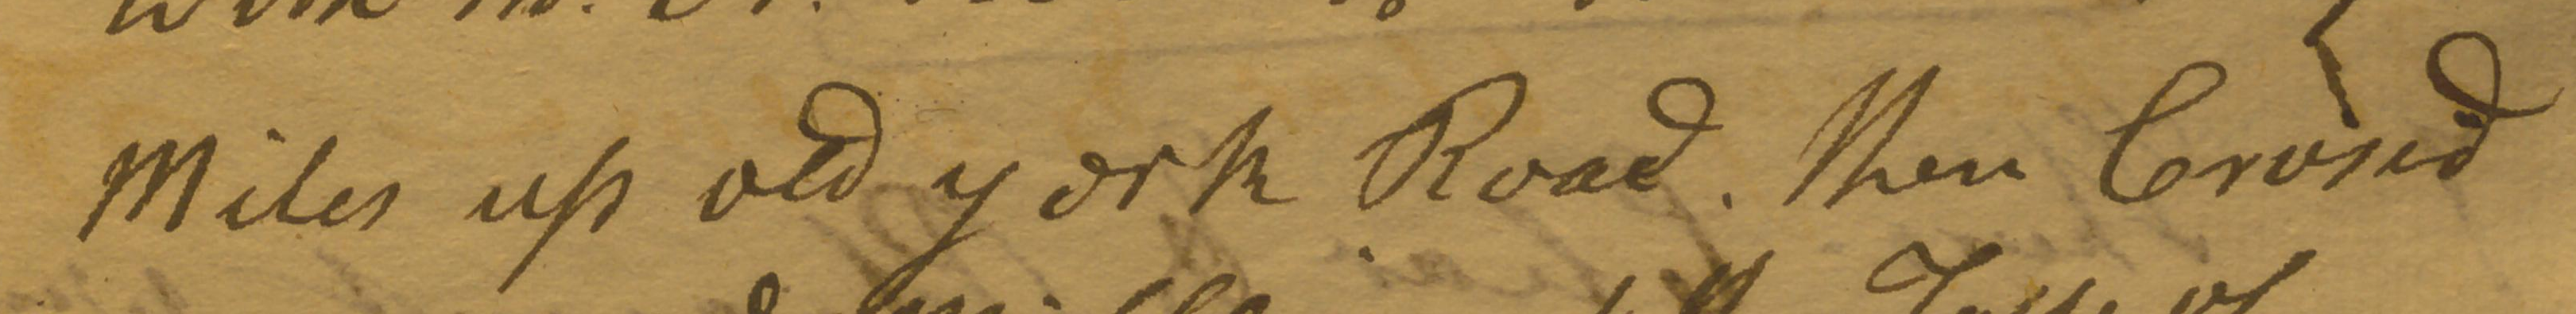Miles up old york Road. then Crosed
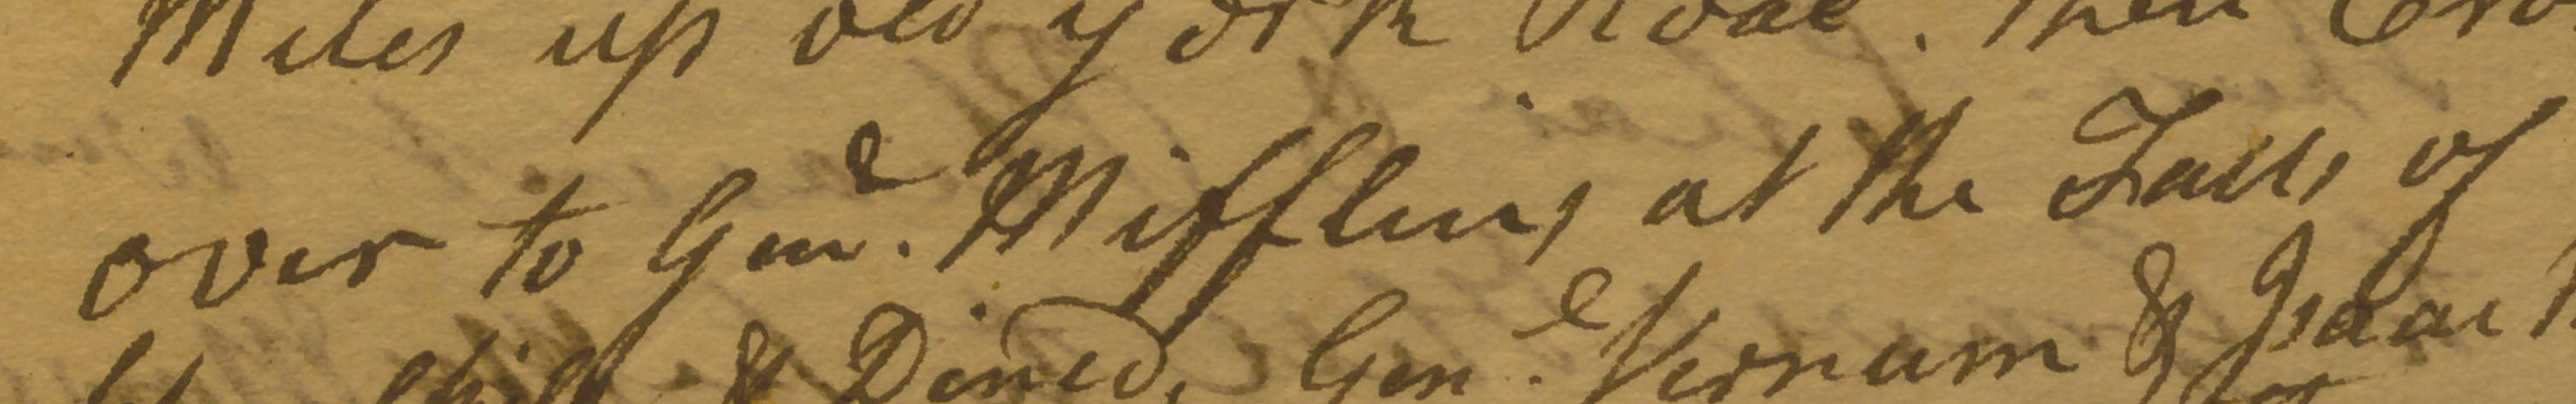over to Gen^l. Mifflins at the Falls of
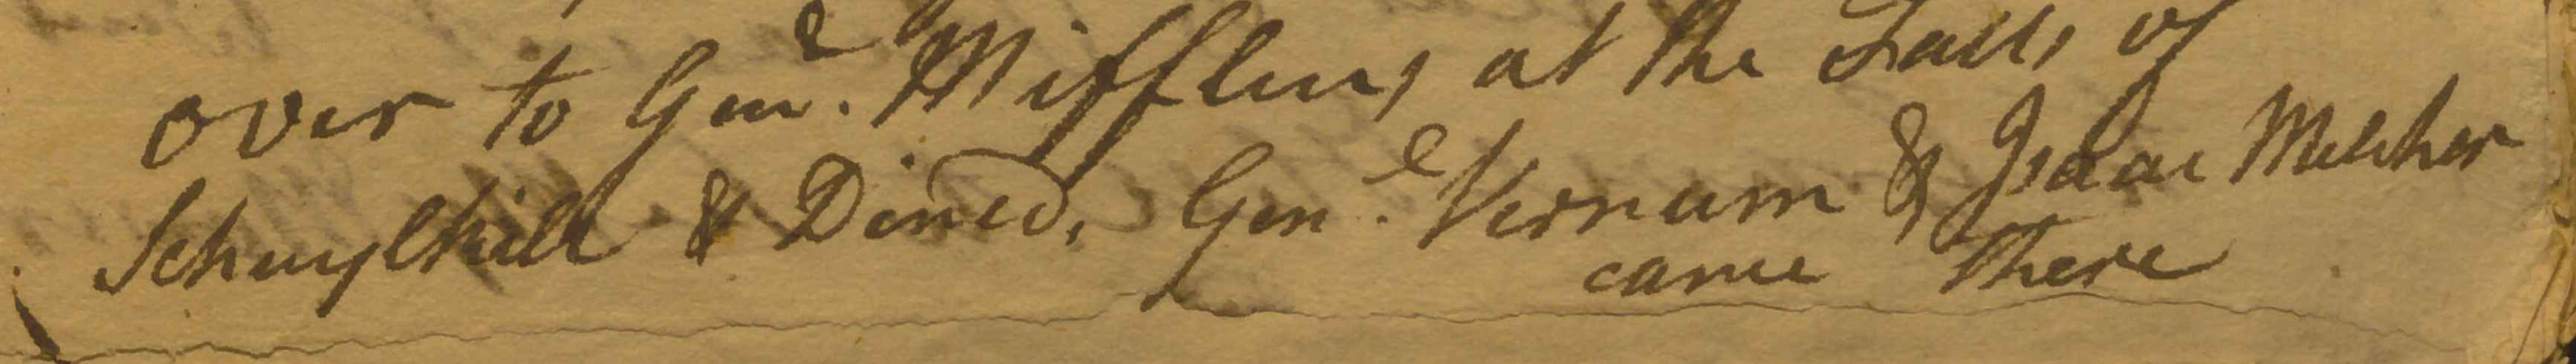Schuylkill & Dined. Gen^l. Vernam & Isaac Milcher
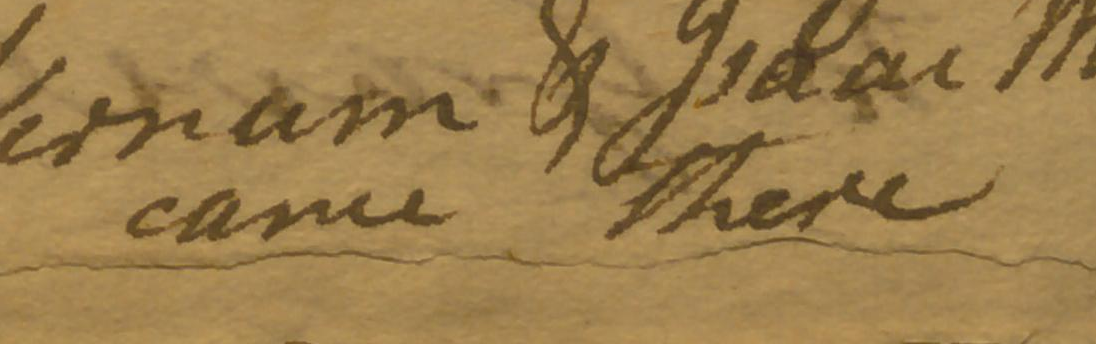came there
